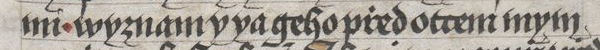mi.wyznam y ya geho pṙed otcem mym
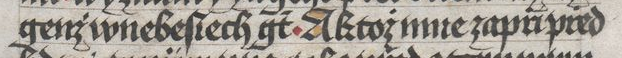genż wnebeſiech ḡt.Aktoż mne zapṙi pṙed
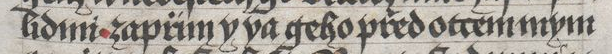lidmi.zapṙim y ya geho před otcem mym
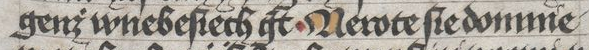genż wnebeſiech ḡt.Nerote ſie domnie¬
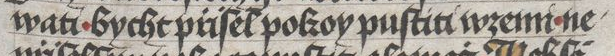wati.bycht pṙiẛel pokoy puſtiti wzemi.ne
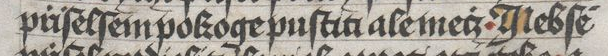pṙiẛelſem pokoge puſtiti ale mecż.Neb ſē
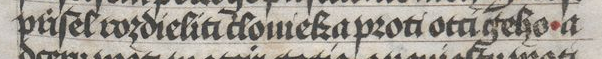pṙiſel rozdíeliti ċlouieka proti otci geho.a
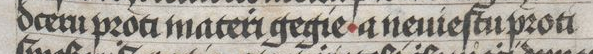dceru proti mateṙi gegíe.a neuieſtu proti
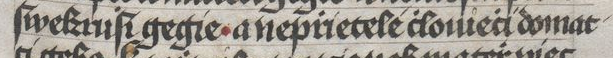ſwekruẛi gegíe.a nepṙietelé ċlouieci domat¬
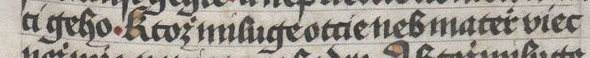cí geho.Ktoż miluge otcie neb mateṙ víec
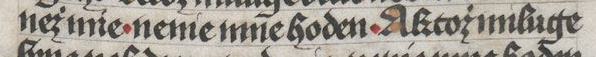neż mie.nenie mne hoden.A ktoż miluge
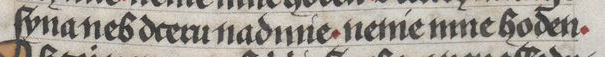ſyna neb dceru nad mie.neníe mne hoden.
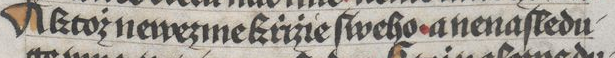A ktoż newezme kṙiżie ſweho.a nenaſledu¬
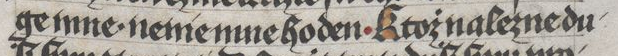ge mne.neníe mne hoden.Ktoż nalezne nedu¬
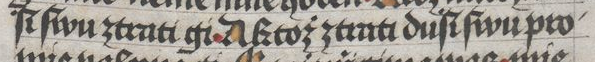ẛi ſwu ztrati gi.Aktoż ztrati duẛi ſwu pro¬
